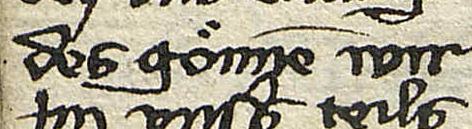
des gönne* wir
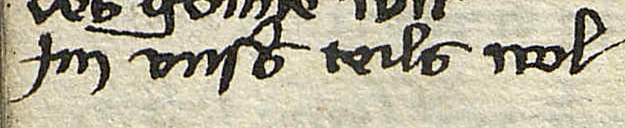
Im vnſ* teils wol
